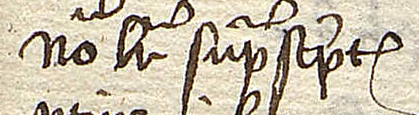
no* lr* ſup* ſc*pt*
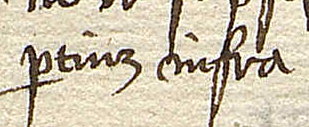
p*tin* infra
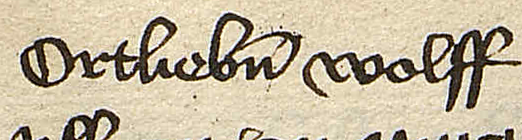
Ortliebn* wolff
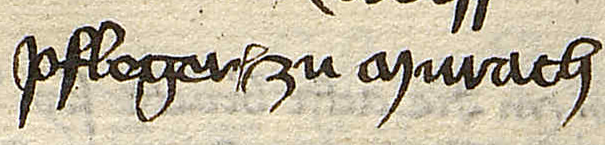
pfleger* cʒu Murach
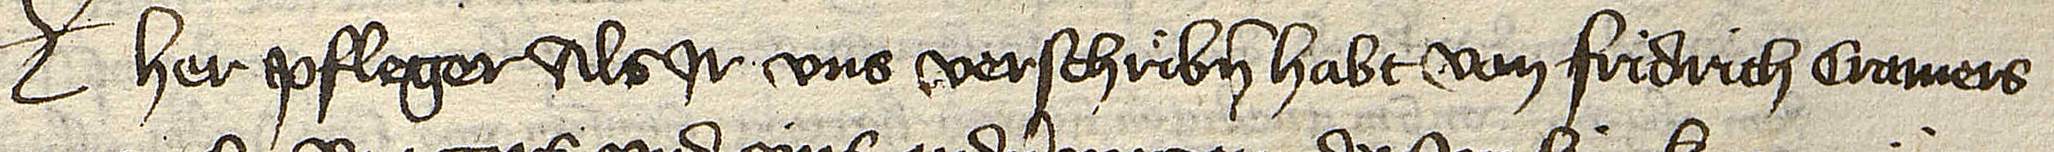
L* her pfleger Als Ir vns verſchribn* habt von fridrich Cramers
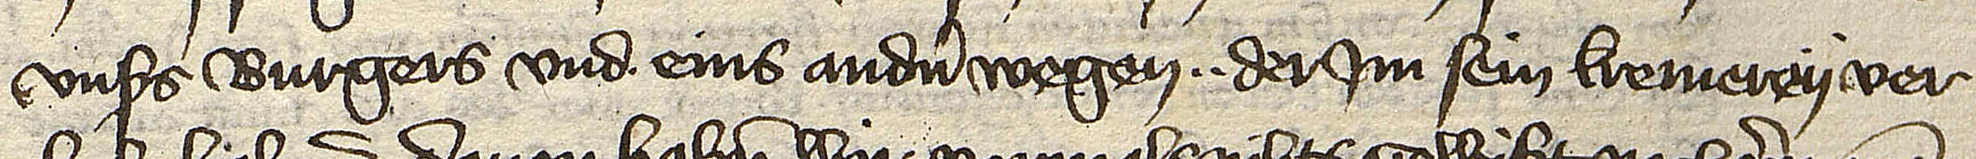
vnſ*s Burgers vnd eins andn* wegen ~ der Im ſein kremerey ver
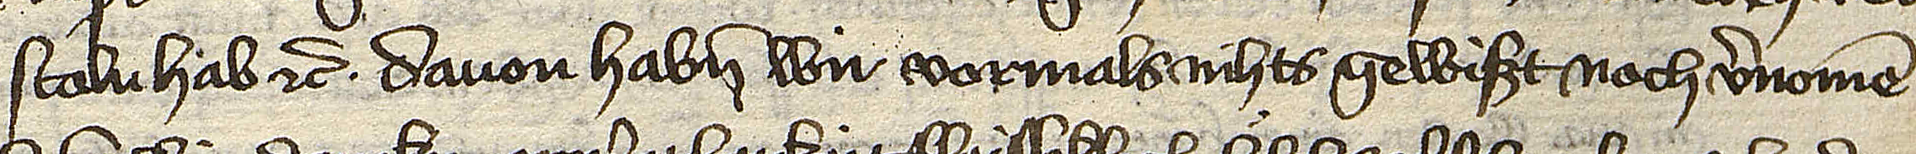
ſtoln hab ec* . dauon habn* wir vormals niht gewiſʒt noch v*nome*
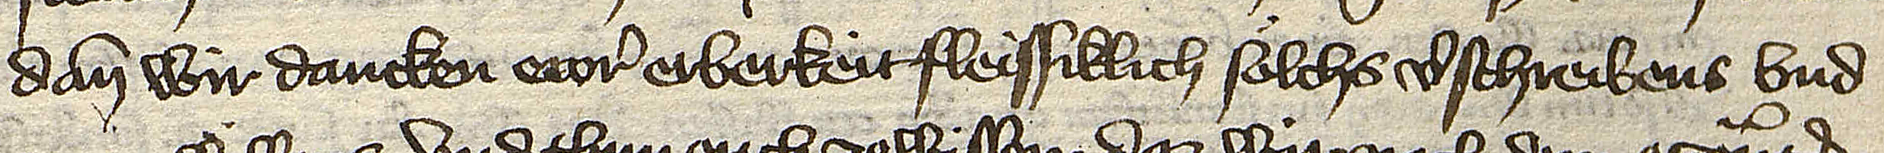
dan* wir dancken ewr* erberkeit fleiſſiklich ſölichs v*ſchreibens vnd
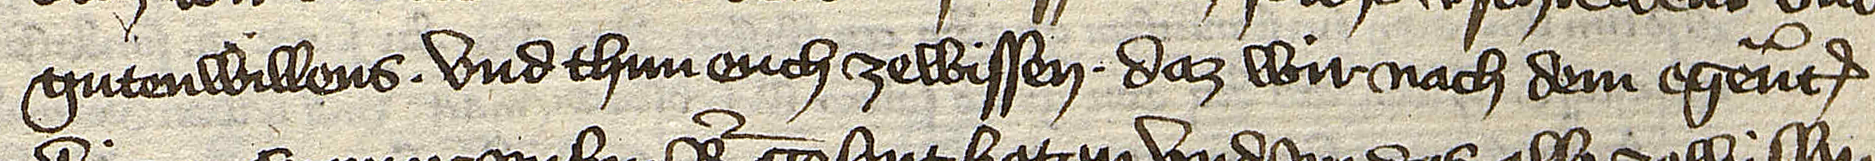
gutenwillens . Vnd thun euch cʒewiſſen . daʒ wir nach dem egen*t*
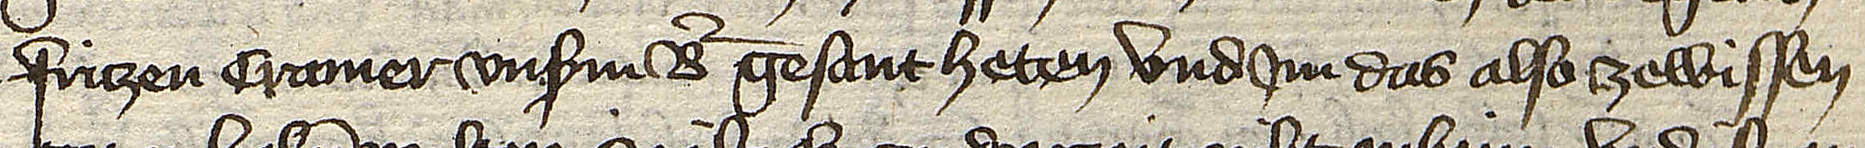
Fricʒen Cramer vnſ*m B* geſant heten vnd Im das alſo cʒewiſſen
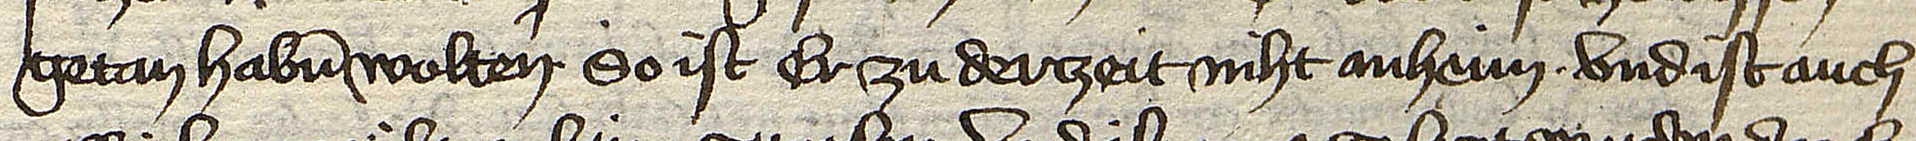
getan habn* wolten . So iſt Er cʒu dercʒeit niht anheim . vnd iſt auch
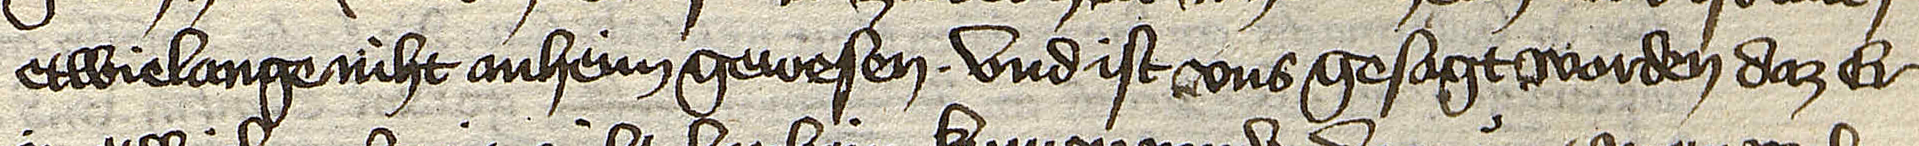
etwielange niht anheim geweſen . vnd iſt vns geſagt worden daʒ Er
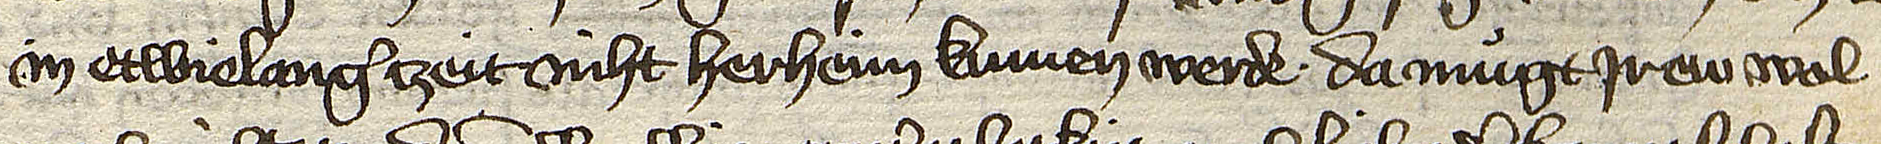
in etwielang* cʒeit niht herheim kumen werde . da mügt Ir ew wol
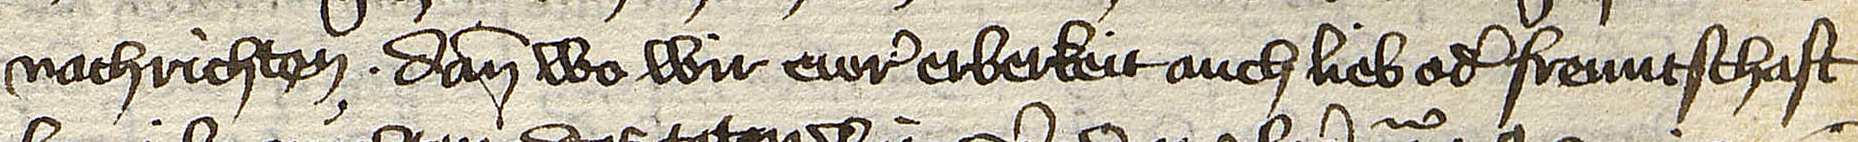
nachrichten . dan* wo wir ewr* erberkeit auch lieb od* freuntſchaft
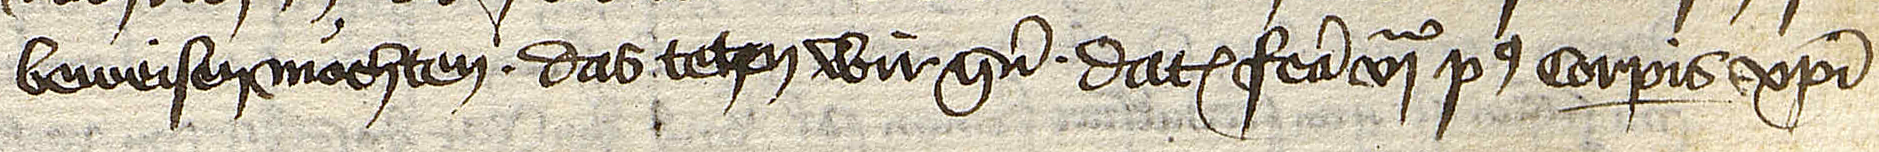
beweiſen möchten . das teten wir g*n . dat* fea* vi* p* Corp*is xpi*
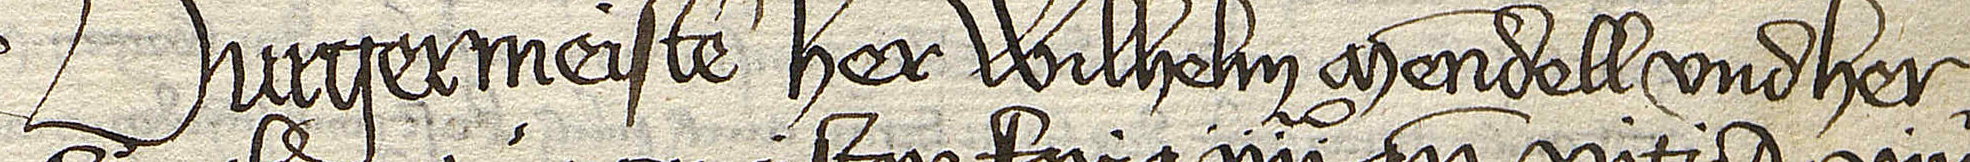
Burgermeiſte* Her Wilhelm Men*dell vnd Her
